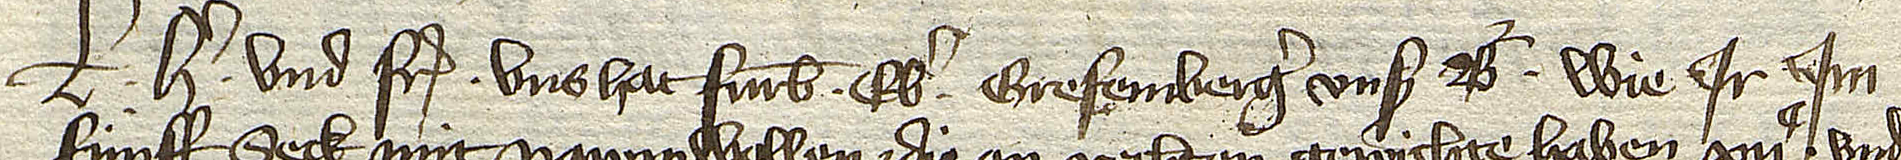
L* . H* . vnd fr* . vns hat furb* . Eb* . Grefemberg* vnſ* B* . wie Ir Im
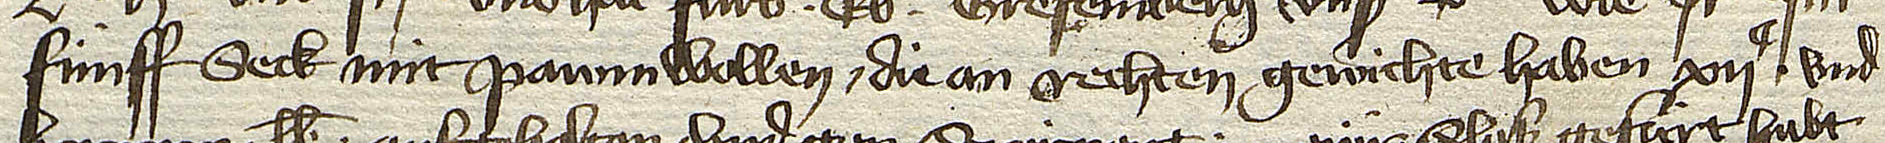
fünff Seck mit pawmwollen / die an rechten gewichte haben xii* . vnd
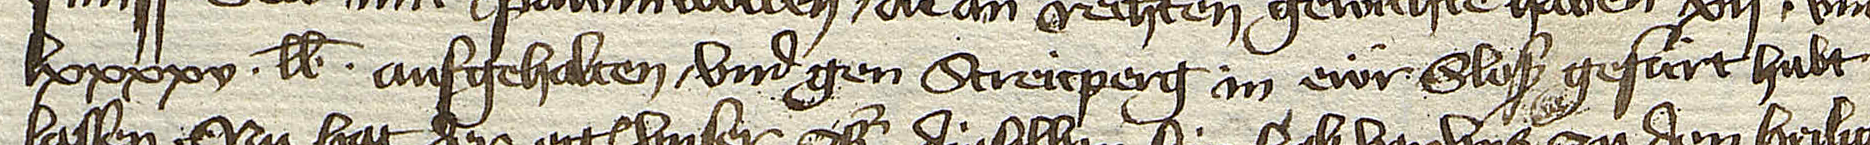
lxxxxv . lb* . aufgehalten / vnd gen Streitperg in ewr Sloſʒ gefürt habt
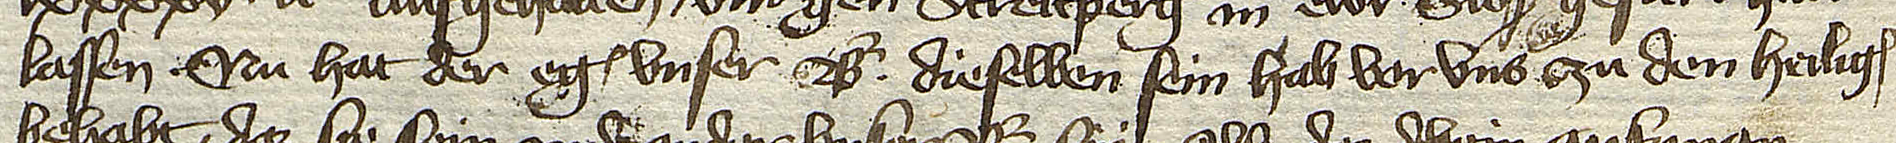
laſſen . Nu hat der eg* vnſer B* . dieſelben ſein hab vor vns cʒu den heilig*
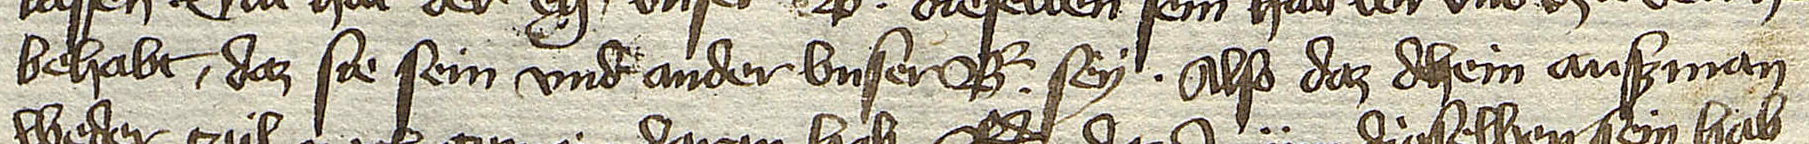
behabt / daʒ ſie ſein vnd ander vnſer B* . ſey . Alſo daʒ dhein auſʒman
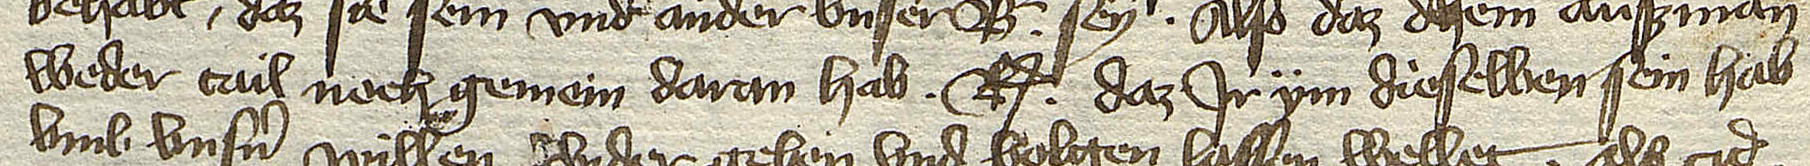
weder tail noch gemein daran hab . R* . daʒ Ir ym dieſelben ſein hab
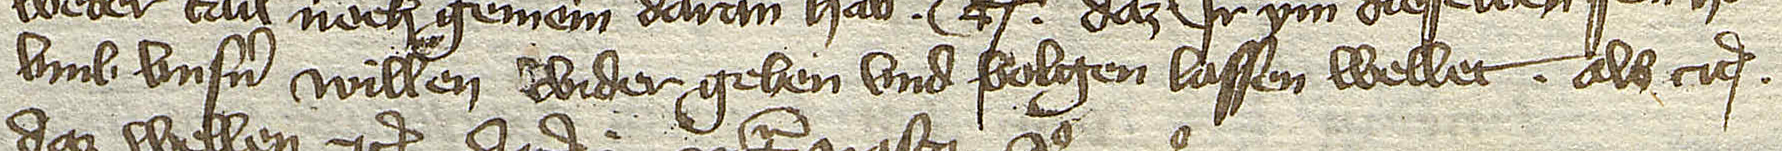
vmb vnſ*n willen wider geben vnd volgen laſſen wellet . als ec*
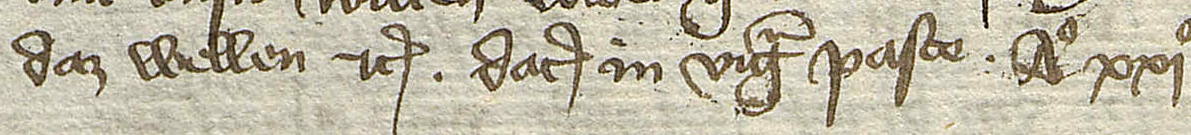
daʒ wellen ec* . dat* in vig* pasce . A* xxi* -
